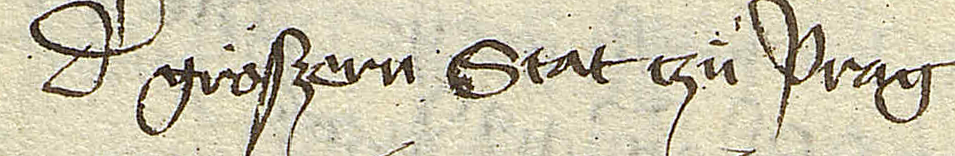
D* gröſʒern Stat cʒü Prag
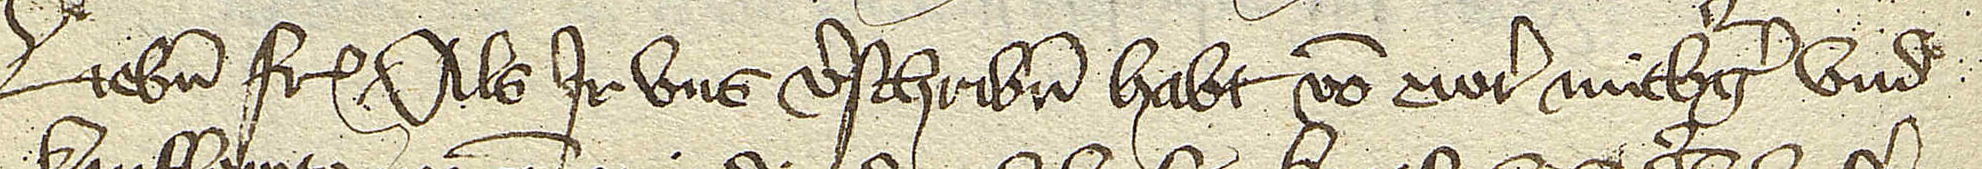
Liebn* fr* / Als Ir vns v*ſchribn* habt vo* ewr* mitb*g* vnd
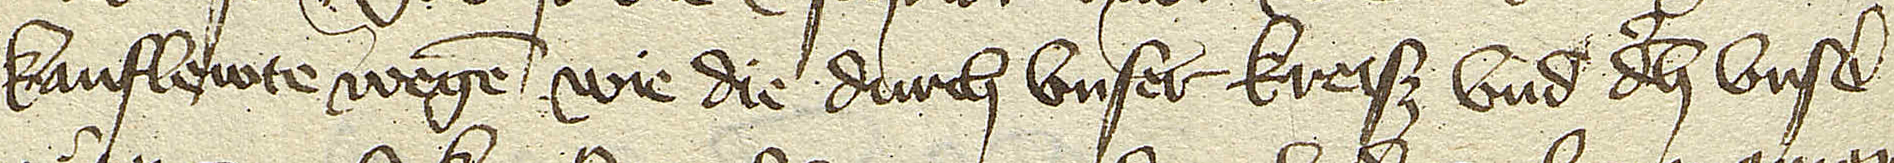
kauflewte wege* wie die durch vnſer kreiſʒ vnd d*h vnſe*
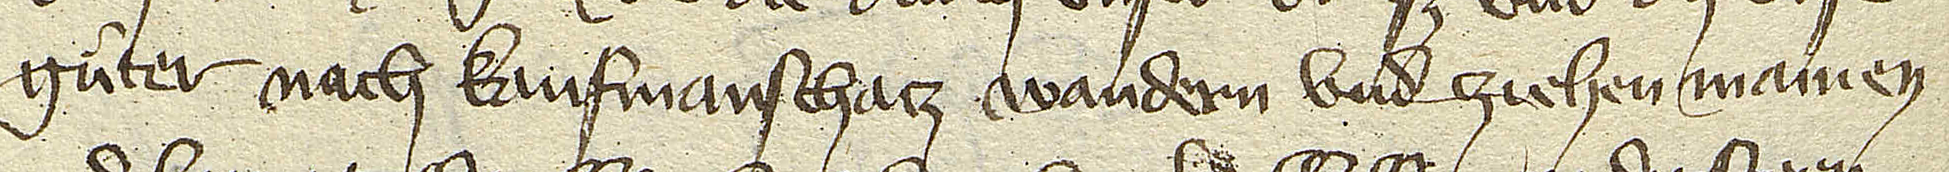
güter nach kaufmanſchacʒ wandern vnd cʒiehen mainen
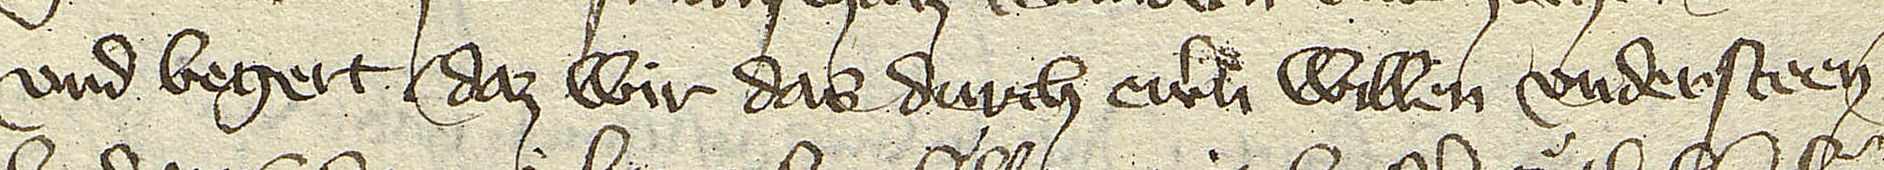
vnd begert / daʒ wir das durch ew*n willen vnderſteen
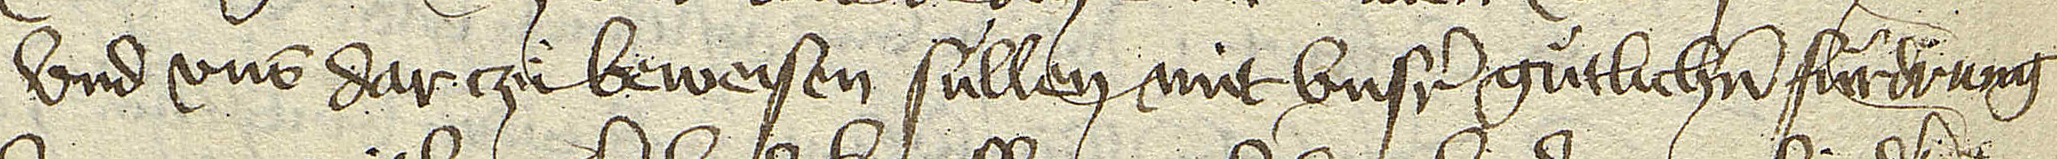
vnd vns dar cʒü beweiſen ſüllen mit vnſr* gütlichn* fürdrung
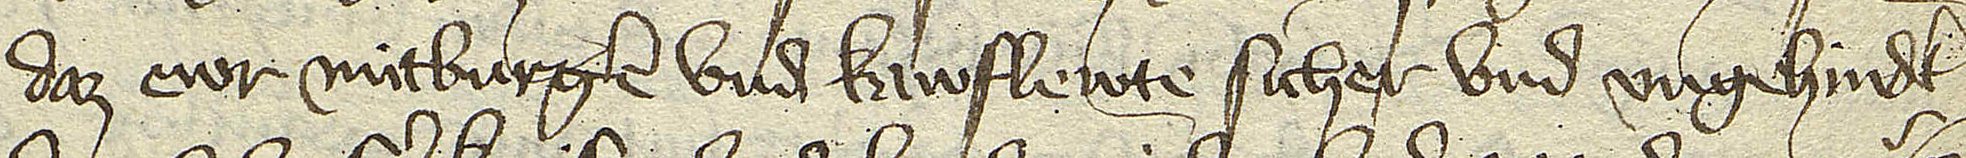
daʒ ewr mitburge* vnd kawflewte ſicher vnd vngehindt*
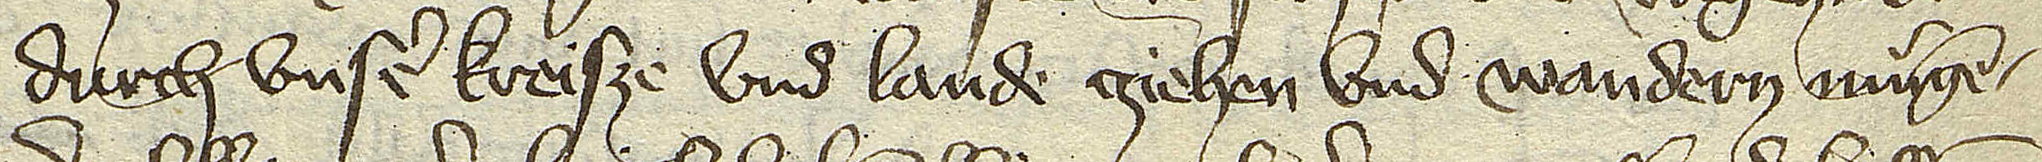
durch vnſe* kreiſʒe vnd lande cʒiehen vnd wandern müge* /
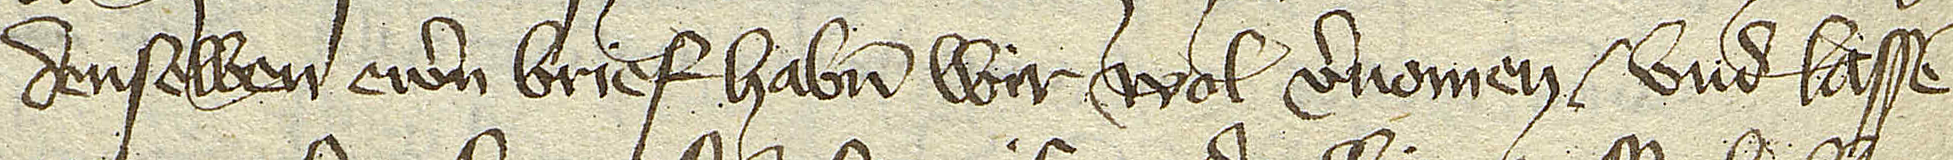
denſelben ew*n brief habn* wir wol v*nomen / vnd laſſe*
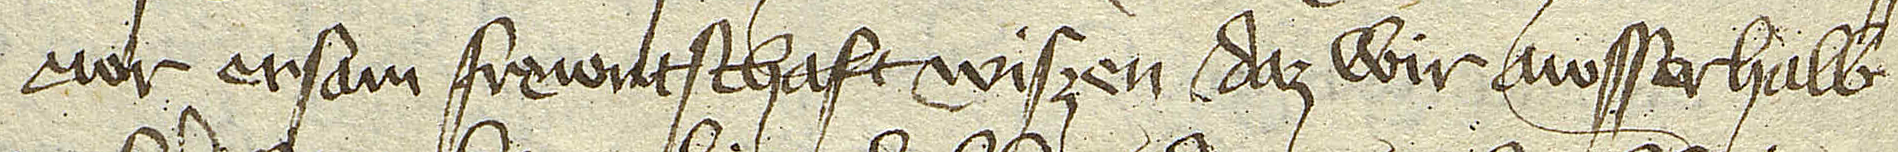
ewr erſam frewntſchaft wiſʒen / daʒ wir awſſerhalb
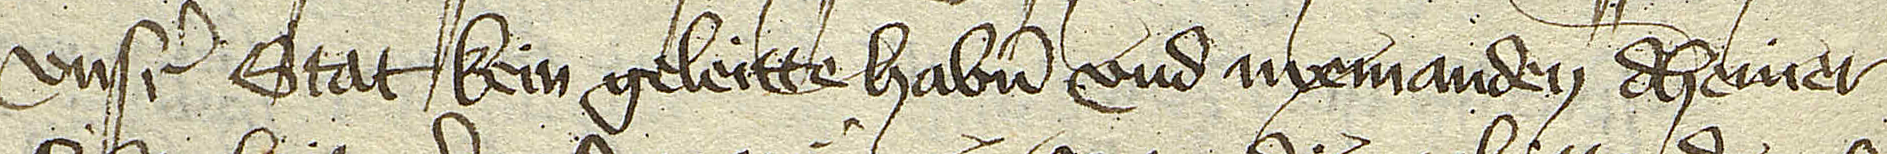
vnſr* Stat kein geleitte habn* vnd nyemanden dheiner
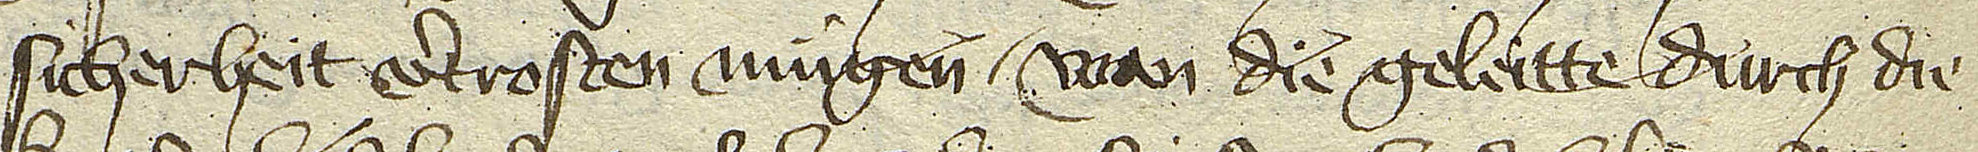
ſicherheit v*troſten mügen / wan die geleitte durch die
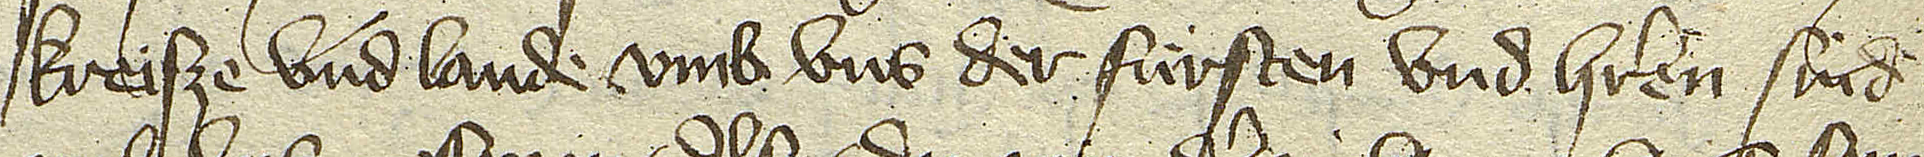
kreiſʒe vnd lande vmb vns der fürſten vnd hr*en ſind
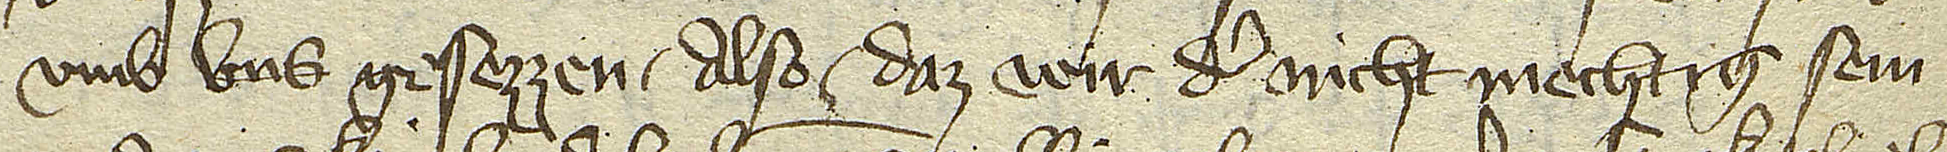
vmb vns geſeʒʒen / Alſo / daʒ wir d* nicht mechtig ſein
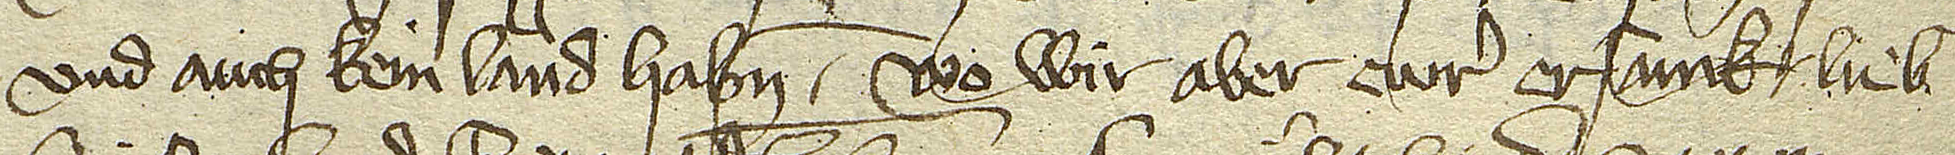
vnd auch kein land habn* / wo wir aber ewr* erſamk* / lieb
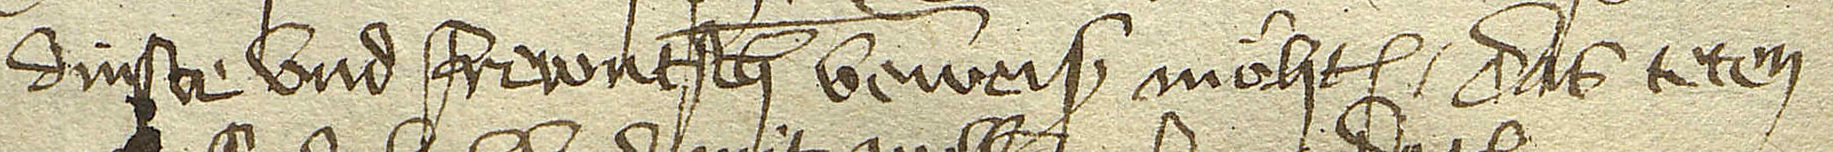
dinſte vnd frewntſch* beweiſ* möht* / Das teten
